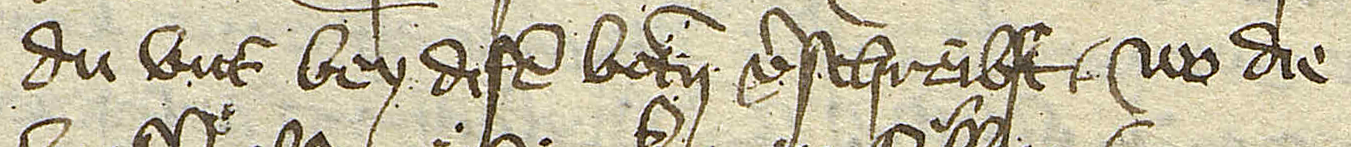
du vns bey diſe* botn* v*ſchreibſt / wo die
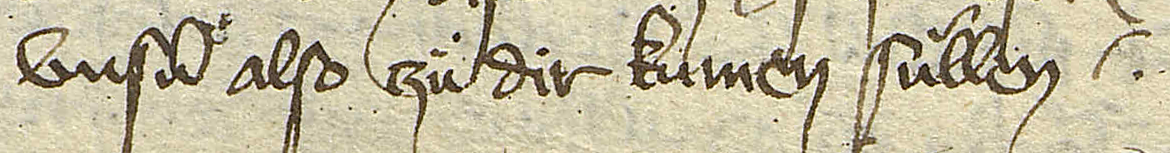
vnſn* alſo cʒü dir kumen ſüllen / .
